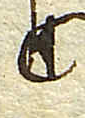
C
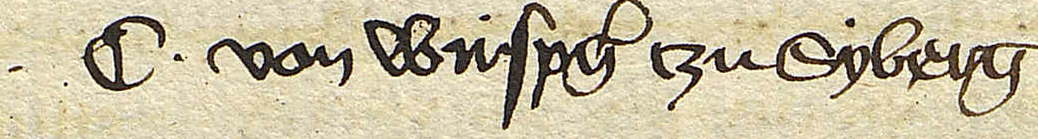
C . von Wirſpg* cʒu Syberg
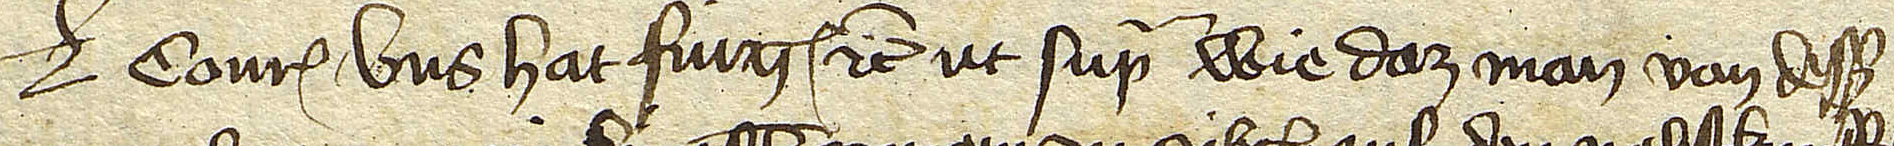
L* Conr* / Vns hat fürg* ec* ut ſup* wie daʒ man von deſſ*
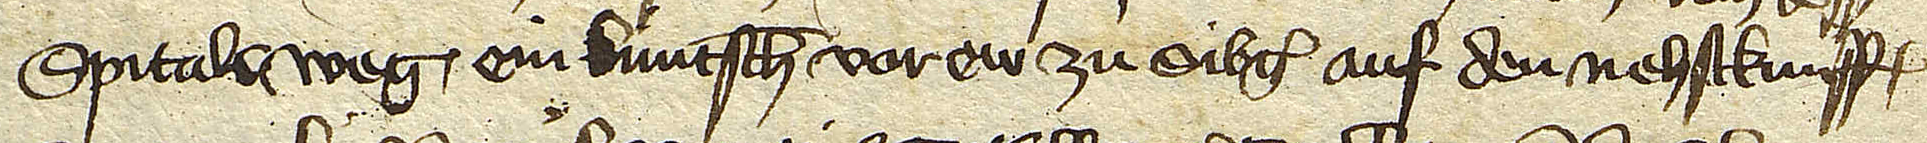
Spitals weg* ein küntſch* vor ew cʒu Sibg* auf den nehſtkunff*
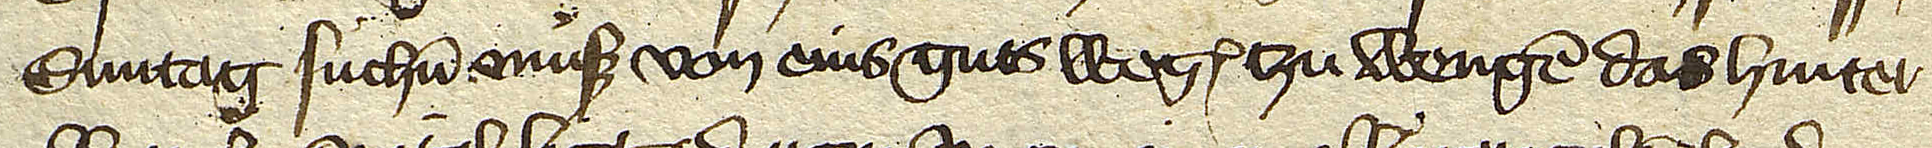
Suntag ſüchn* müſʒ von eins guts weg* cʒu wenge* das hinter
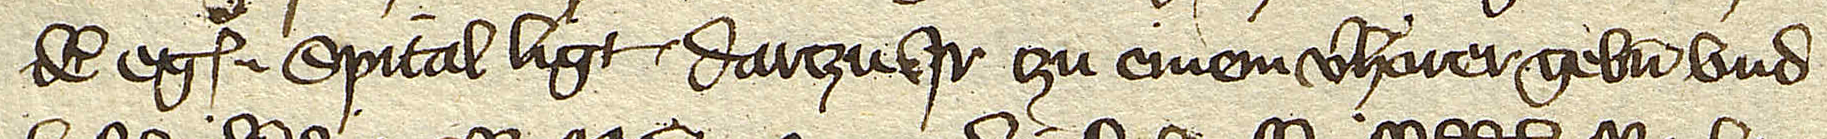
de* eg* ~ Spital ligt / darcʒu Ir cʒu einem v*hörer gebn* vnd
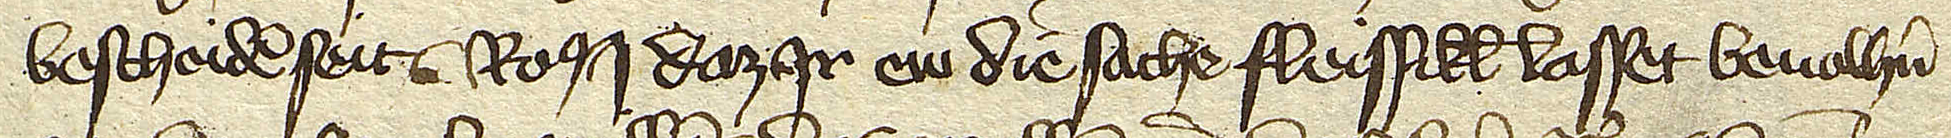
beſcheid* ſeit / Ro* / daʒ Ir ew die ſache fleiſſikl* laſſet beuolhn*
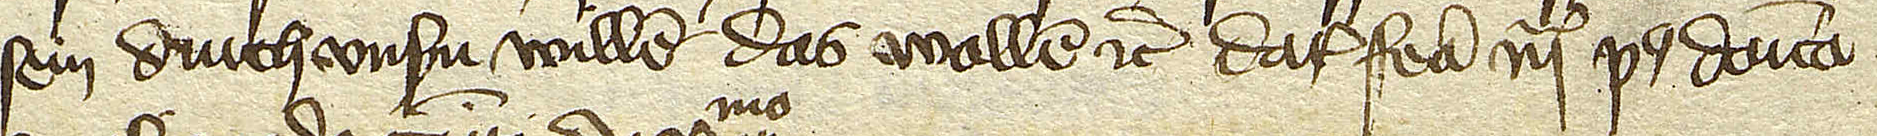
ſein durch vnſ*n wille* / das wolle* ec* dat* fea* iii* p* doica*
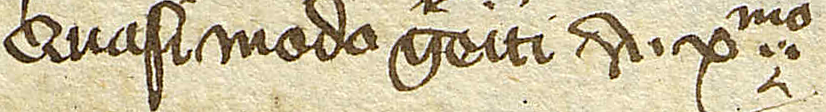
Quaſimodo geiti* / A . x*
